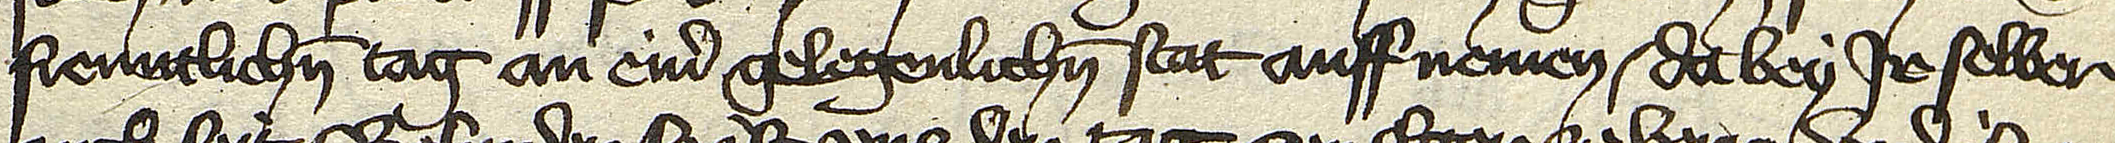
freuntlichn* tag an ein* gelegenlichn* ſtat auff nemen / da bey Ir ſelber
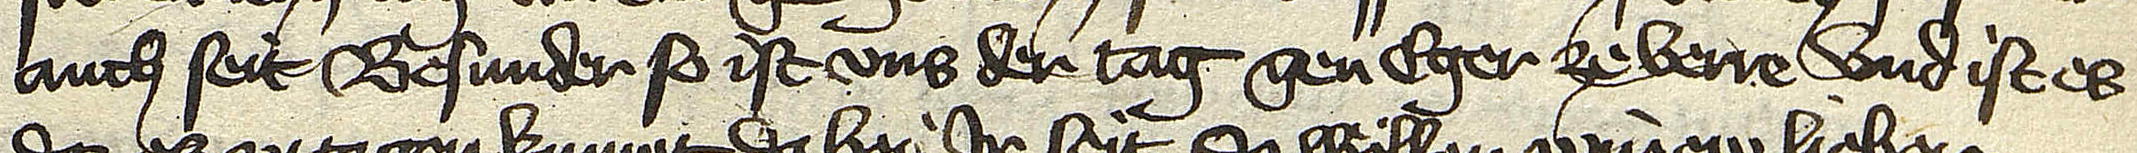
auch ſeit Beſunder ſo iſt vns der tag gen Eger ʒeverre vnd iſt es
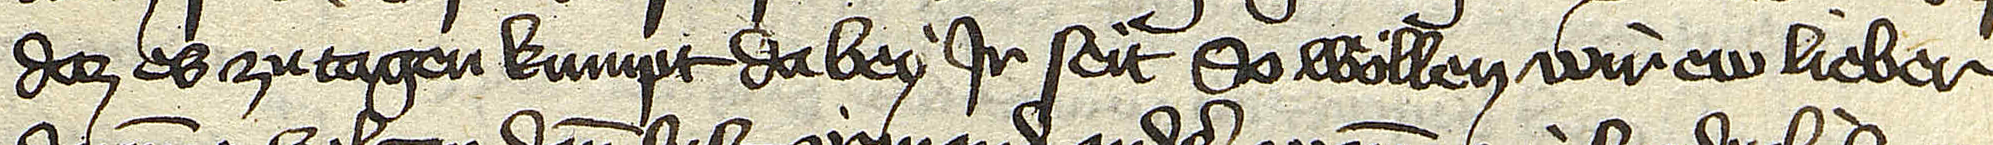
daʒ es cʒu tagen kumpt da bey Ir ſeit So wöllen wir ew lieber
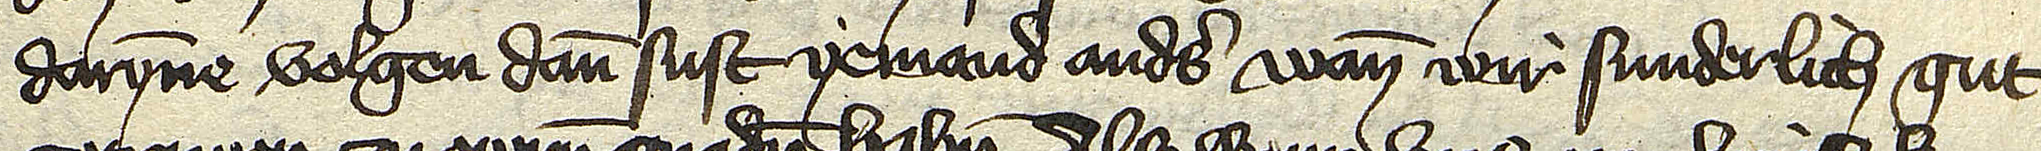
daryne* volgen dan* ſuſt yemand ands* wan* wir ſunderlich gut
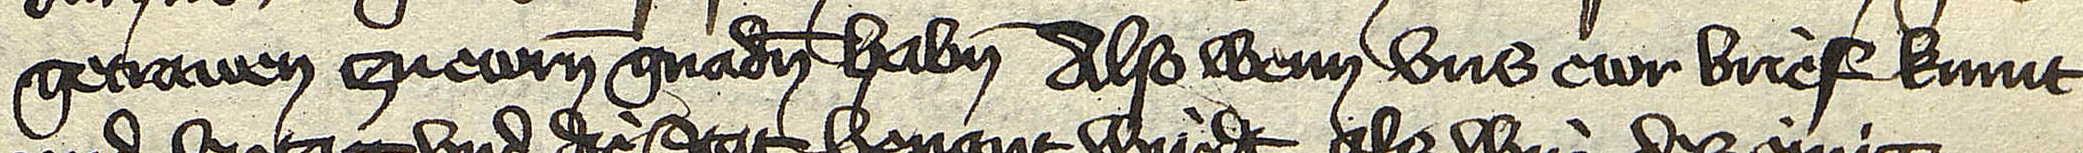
getrawen cʒu ewrn* gnadn* habn* Alſo wenn vns ewr brief kumt
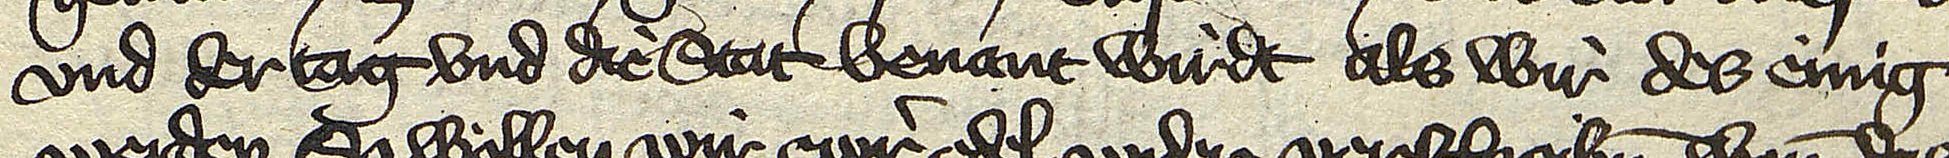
vnd der tag vnd die Stat benant wirdt als wir des einig
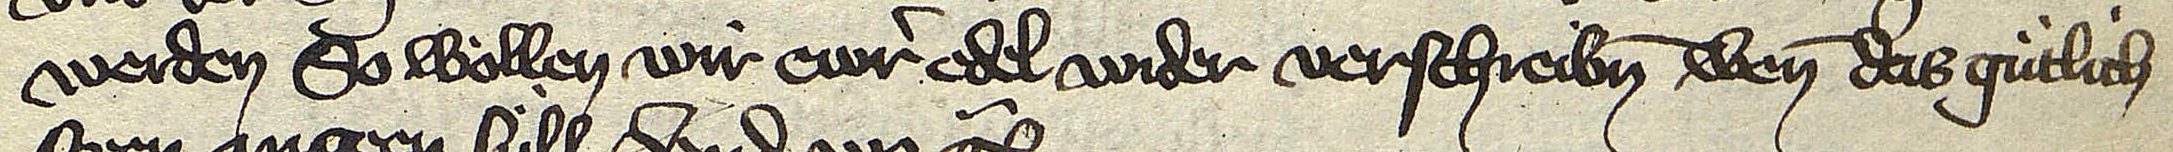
werden So wöllen wir ewr* edel wider verſchreibn* wen* das gütlich
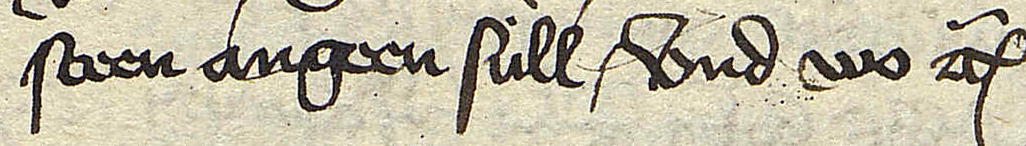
ſteen angeen ſüll / Vnd wo ec*
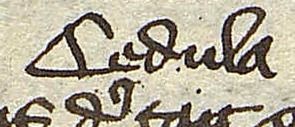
Cedula
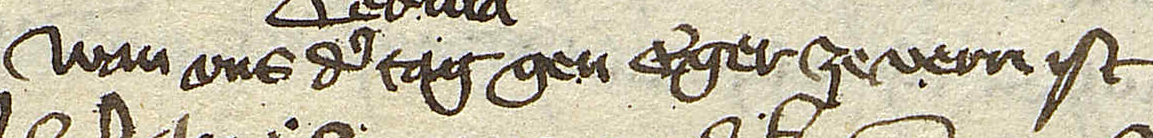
wan vns d* tag gen Eger cʒe vern iſt
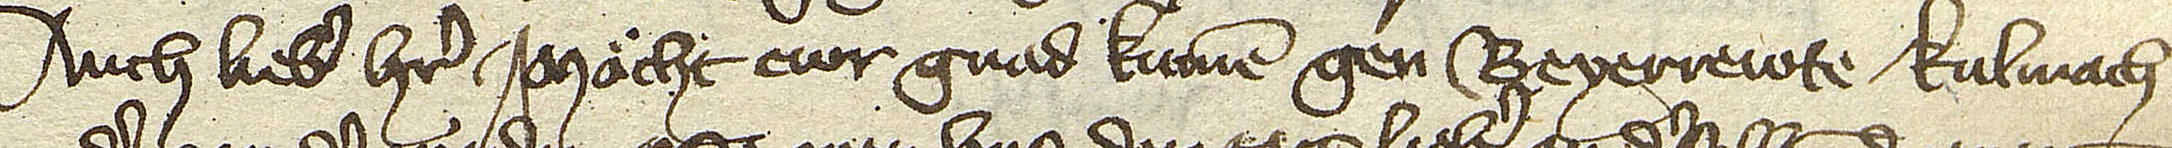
Auch lieb* hr* / Möcht ewr gnad kume* gen Beyerrewte / Kulmach
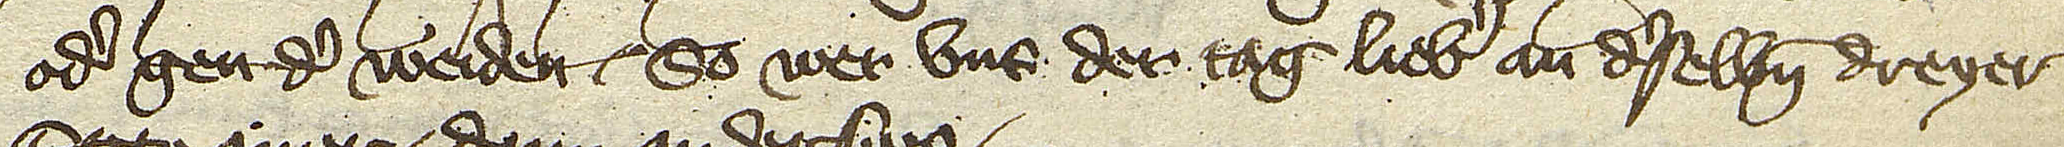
od* gen d* weiden / So wer vns der tag lieb* an d*ſelbn* dreyer
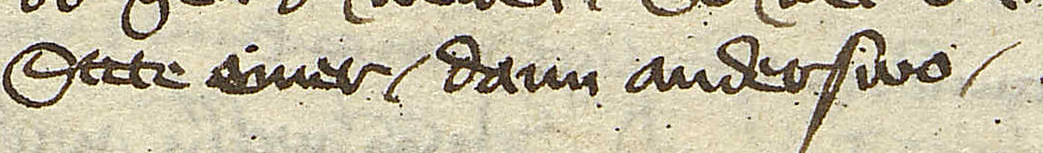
Stete einer / dann anderſwo / .
